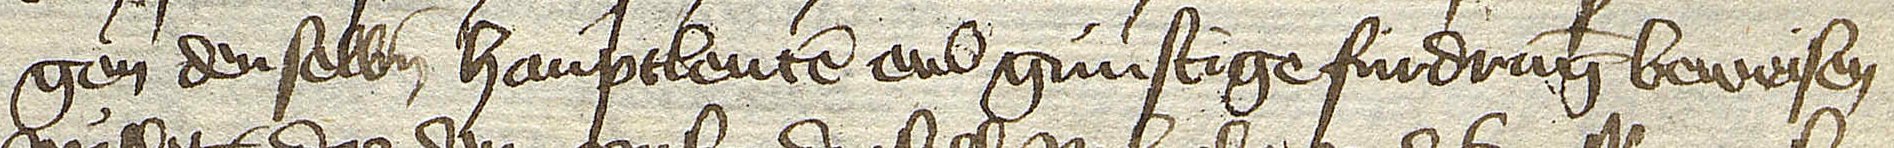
gen denſelbn* hauptleute* ew* günſtige fürdrug* beweiſen
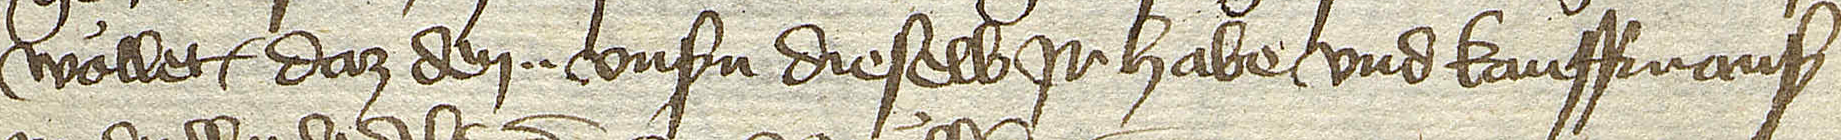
wöllet / daʒ den ~ vnſ*n dieſelb Ir habe vnd kauffmanſ*
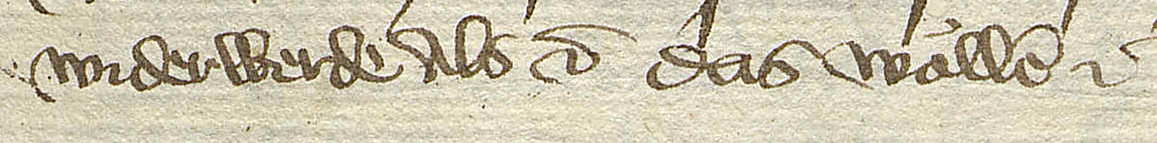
wider werde Als ec* das wölle* ec*
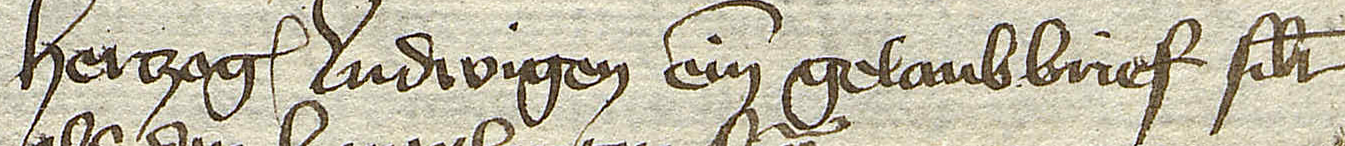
hercʒog* Ludwigen ein* gelaubbrief ſilr*
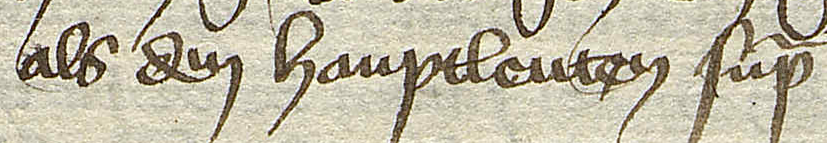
als den hauptleuten ſup*
